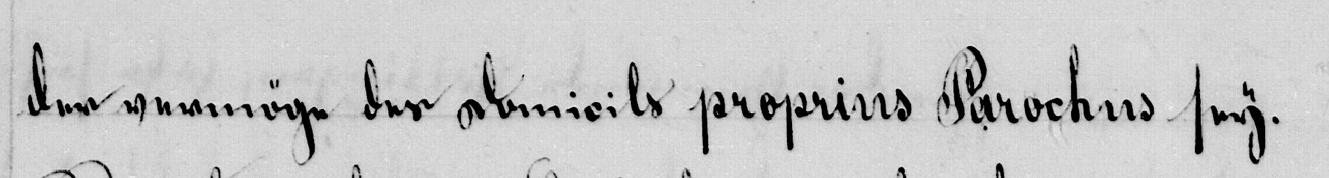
der vermöge des Domicils proprius Parochus sey.
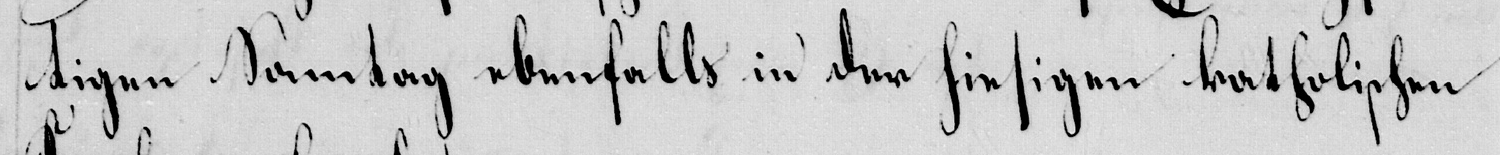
tigen Samstag ebenfalls in der hiesigen katholischen
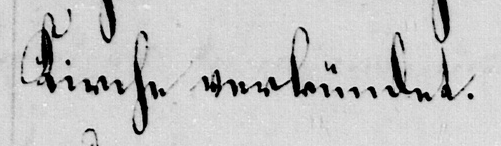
Kirche verkündet.
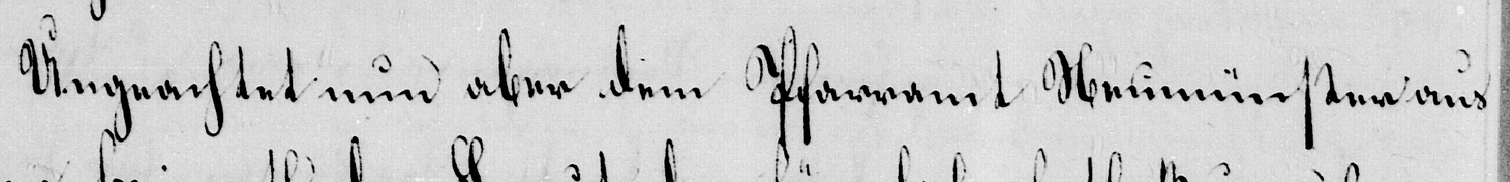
Ungeachtet nun aber dem Pfarramt Neumünster aus
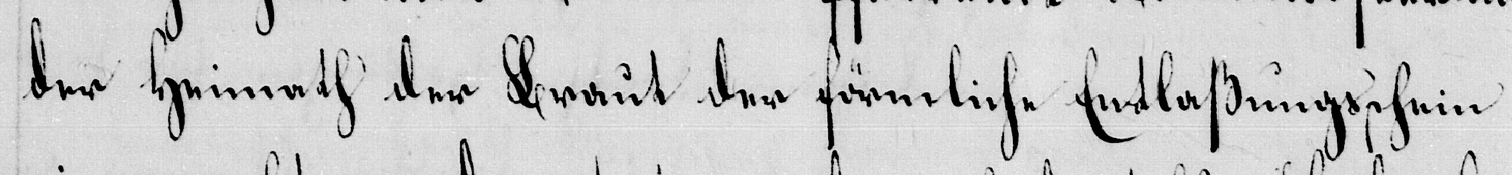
der Heimath der Braut der förmliche Entlaßungsschein
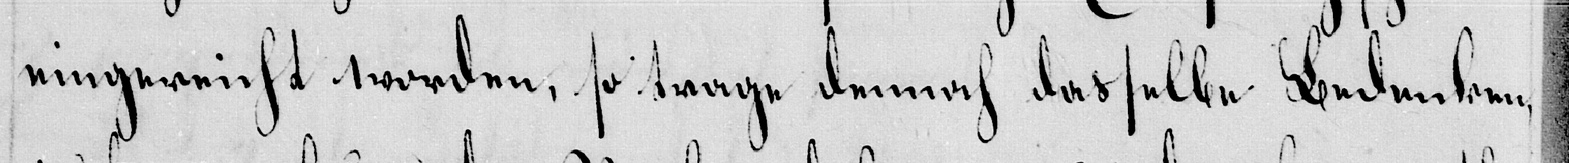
eingereicht worden, so trage demnach dasselbe Bedenken,
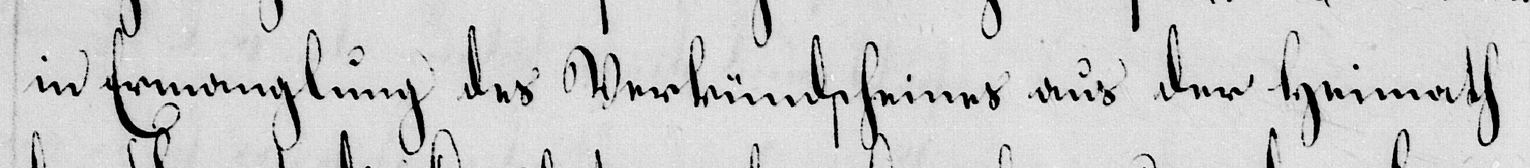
in Ermanglung des Verkündscheines aus der Heimath
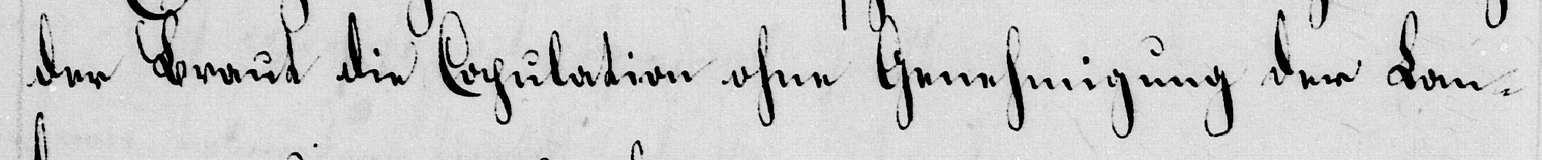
der Braut die Copulation ohne Genehmigung der Lan¬
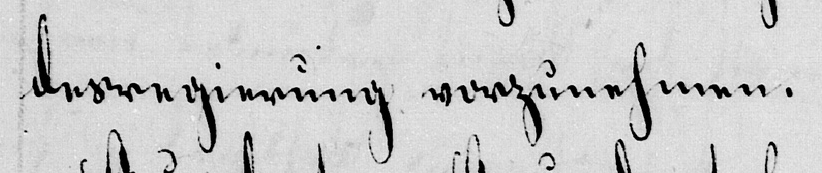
desregierung vorzunehmen.
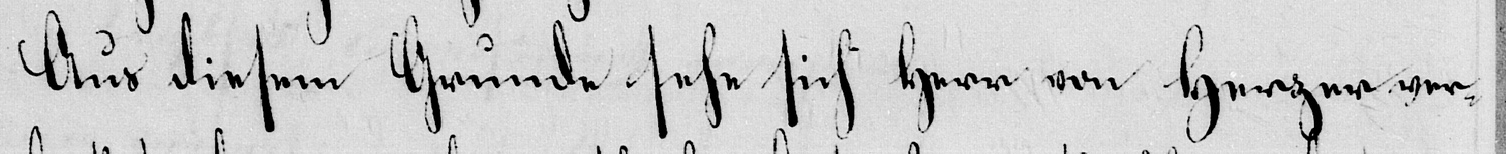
Aus diesem Grunde sehe sich Herr von Herzer ver¬
